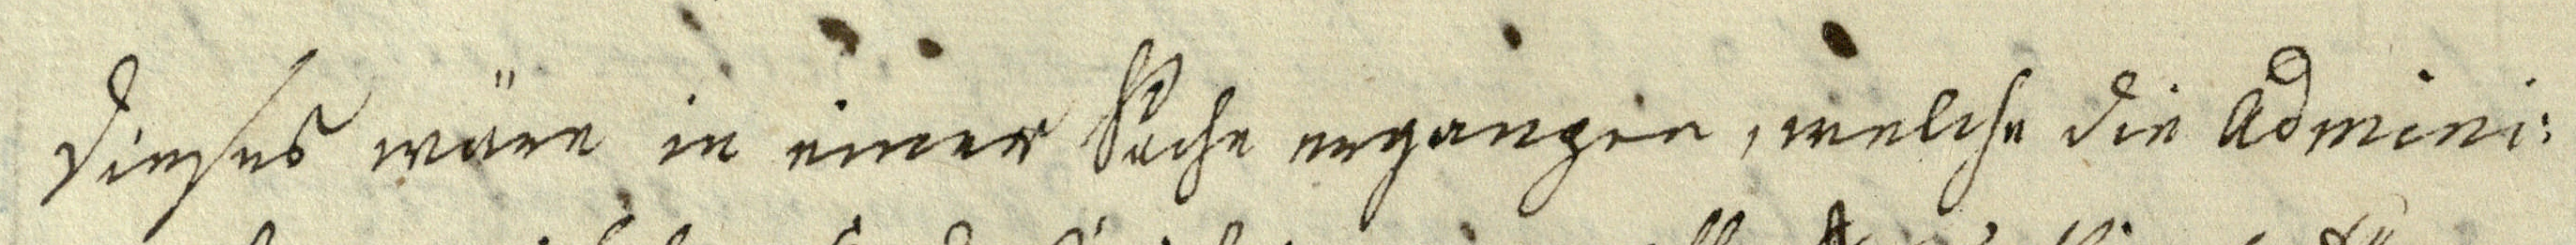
dieses wäre in einer Sache ergangen, welche die Admini¬
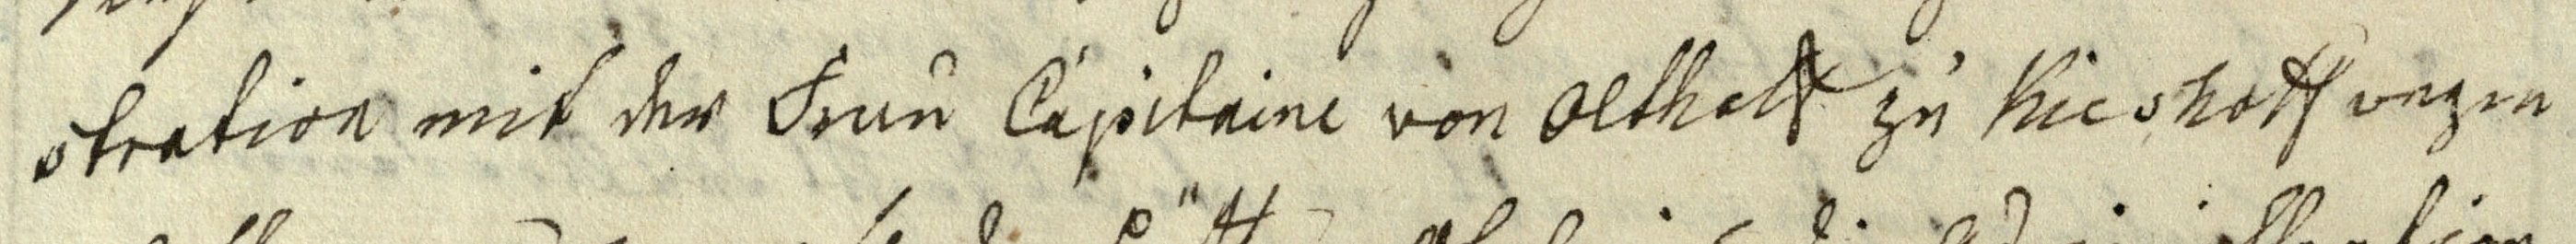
stration mit der Frau Capitaine von Olthoff zu Kieshoff wegen
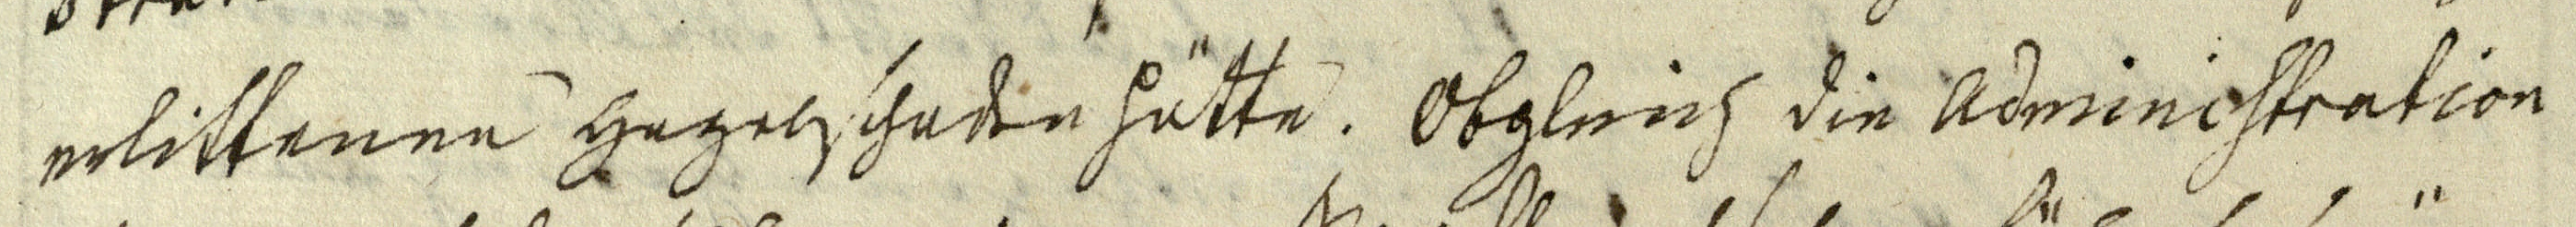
erlittenen Hagelschaden hätte. Obgleich die Administration
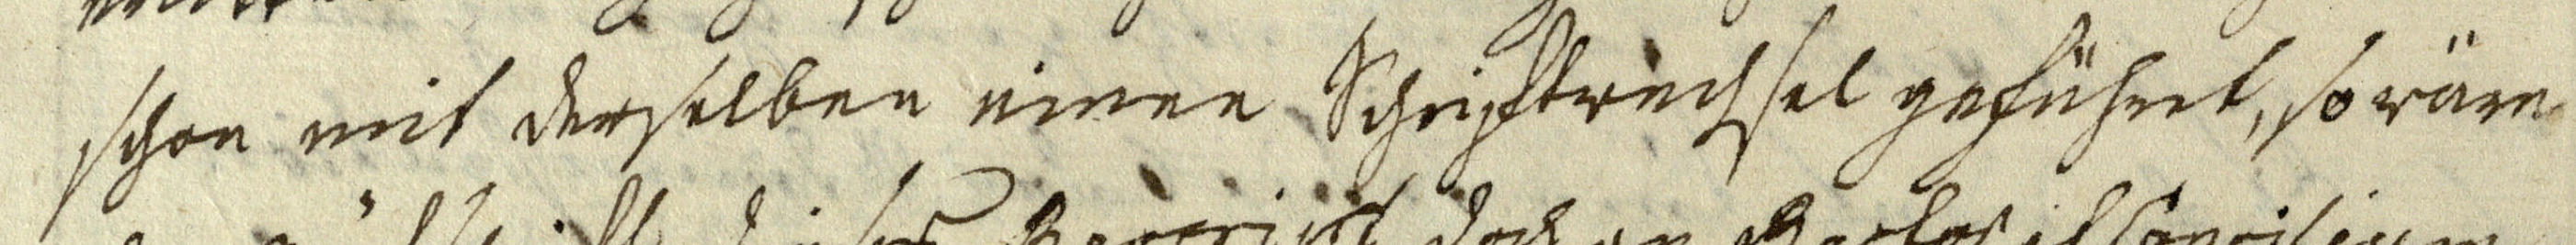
schon mit derselben einen Schriftwechsel geführet, so wäre
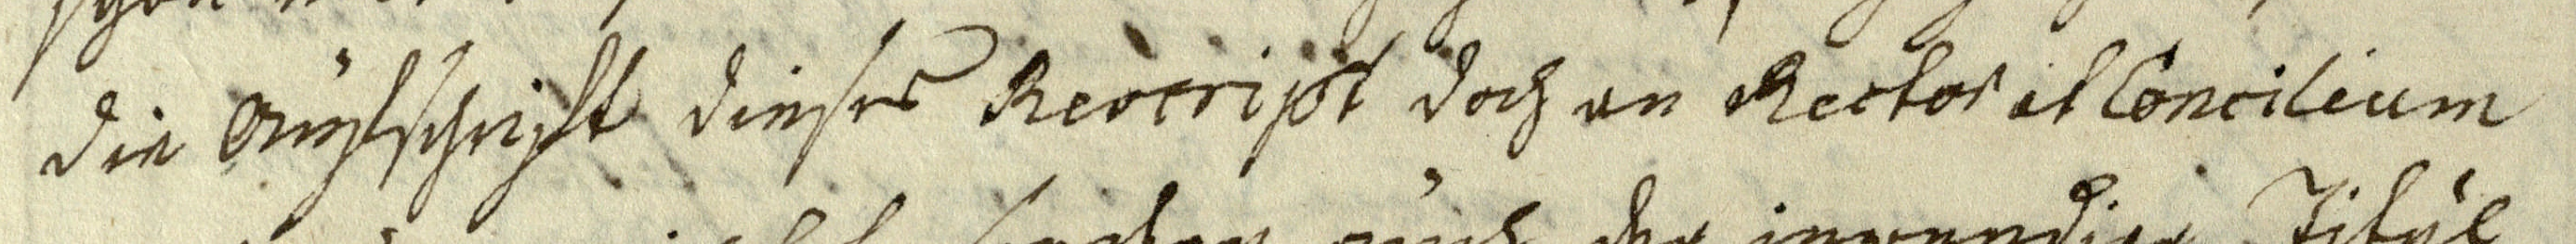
die Aufschrift dieses Rescript doch an Rector et Concilium
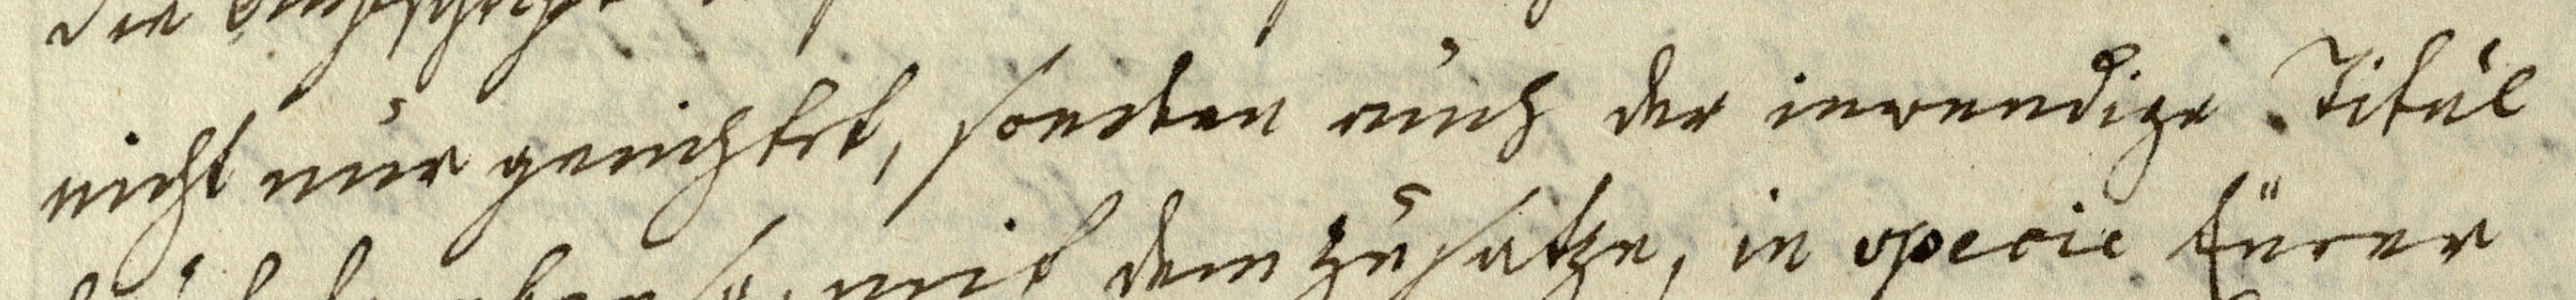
nicht nur gerichtet, sondern auch der inwendige Titul
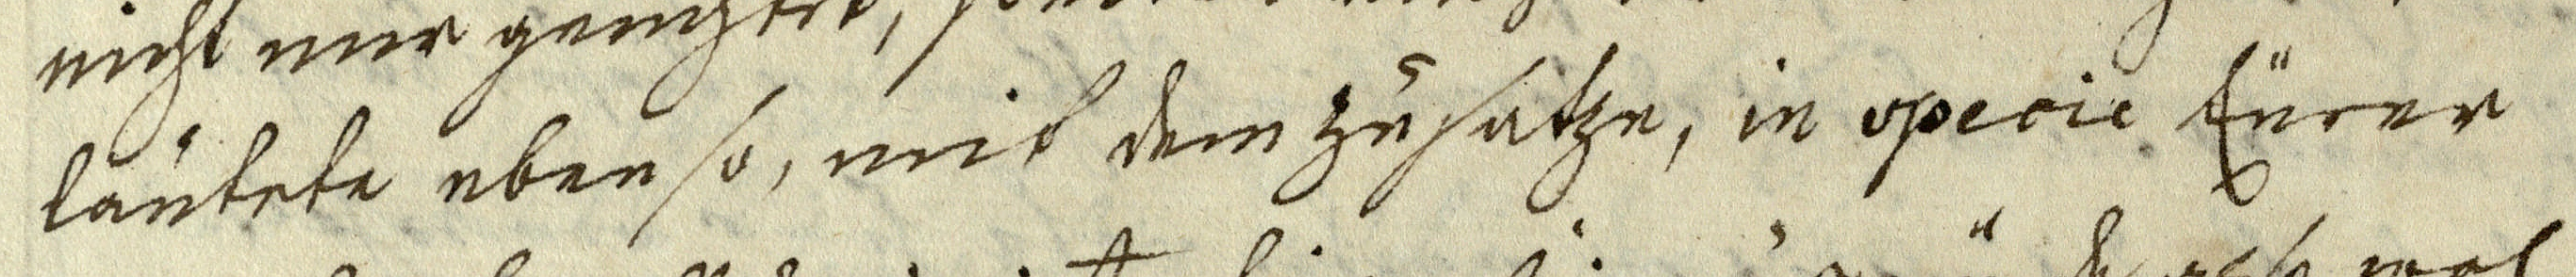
lautete eben so, mit dem Zusatze, in specie Eurer
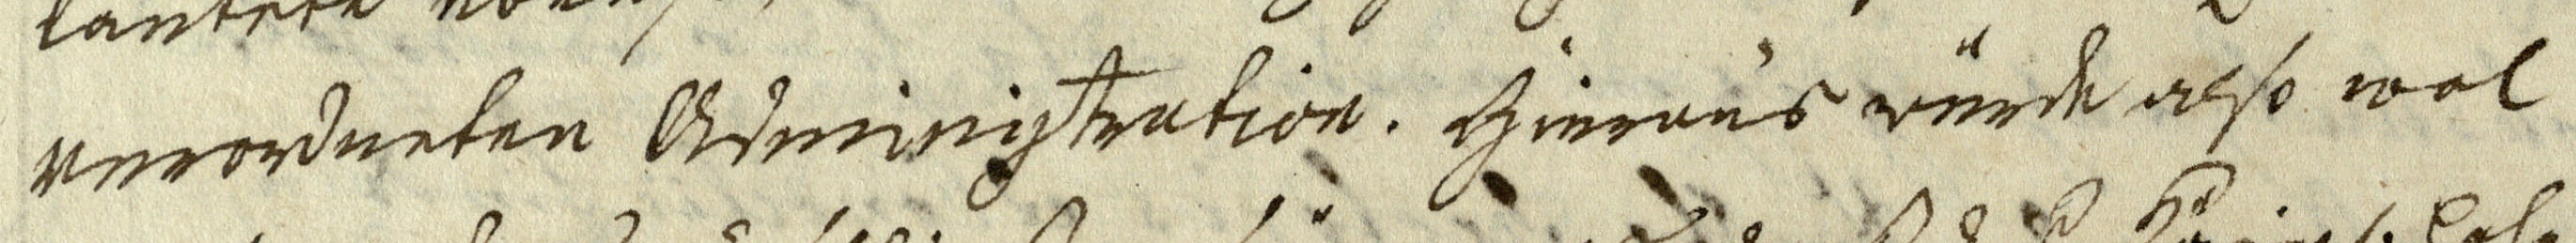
verordneten Administration. Hieraus würde also wol
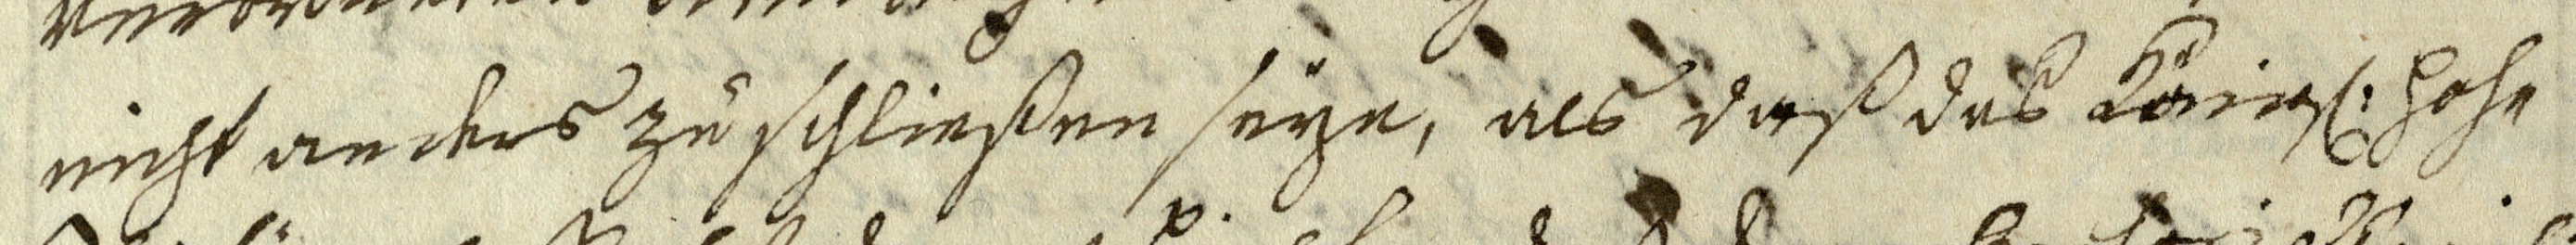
nicht anders zu schließen seÿn, als daß das Königl. hohe
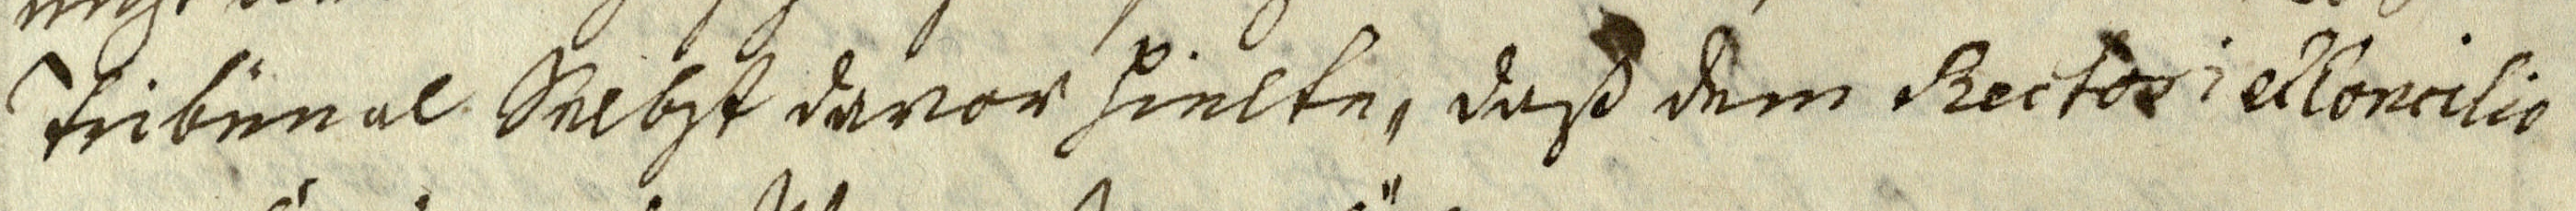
Tribunal Selbst davor hielte, daß dem Rectori et Concilio
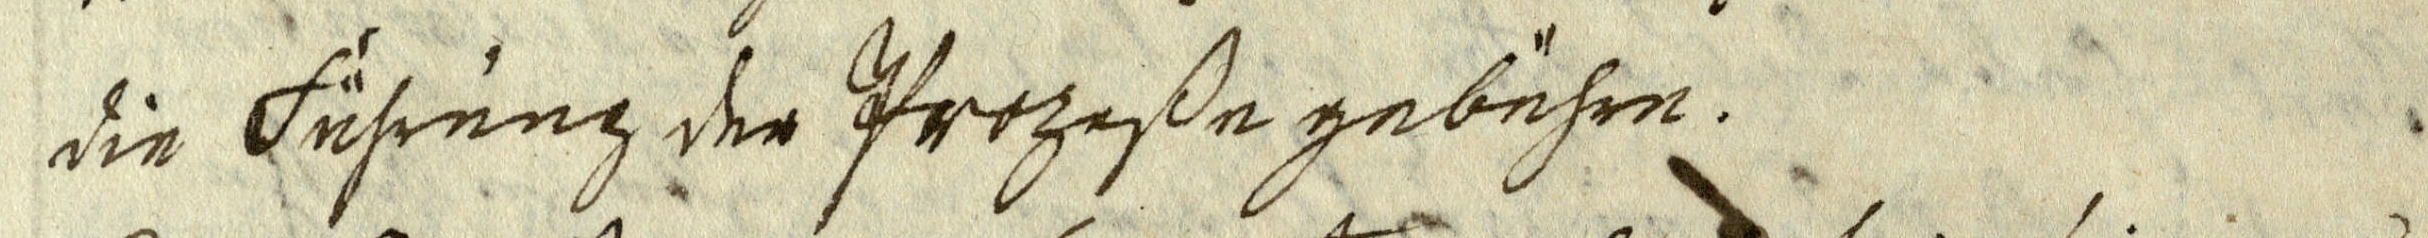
die Führung der Prozeße gebühre.
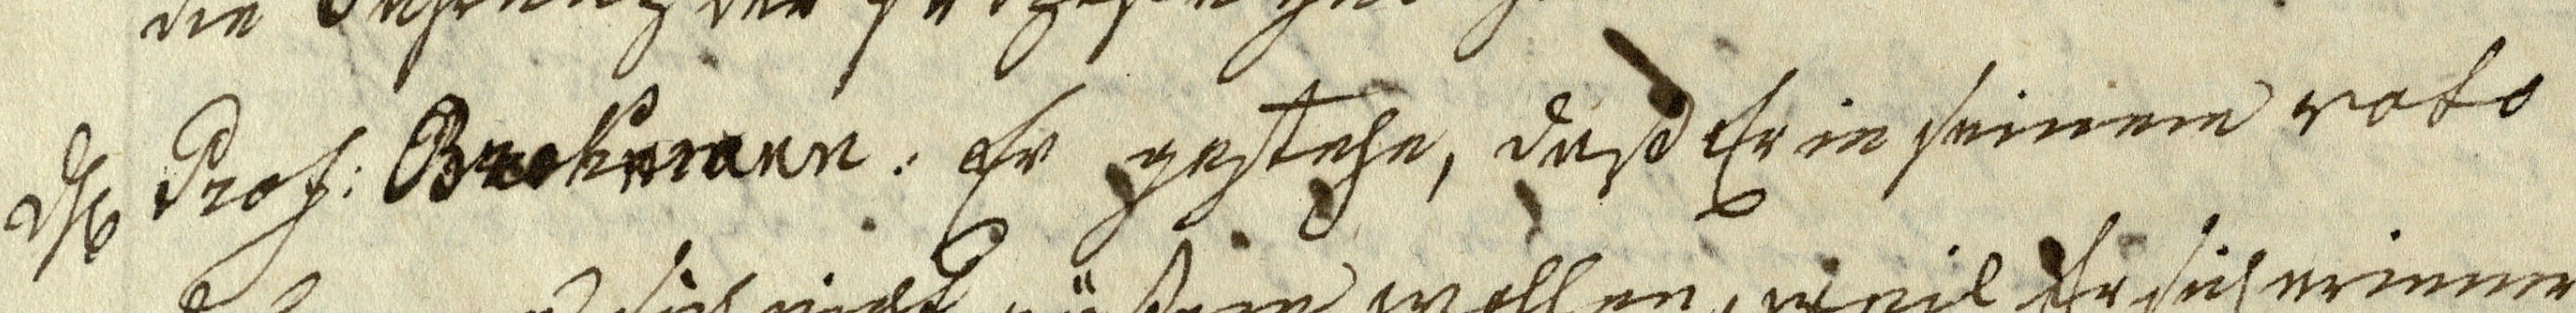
dh Prof. Brokamnn: Er gestehe, daß Er in seinem voto
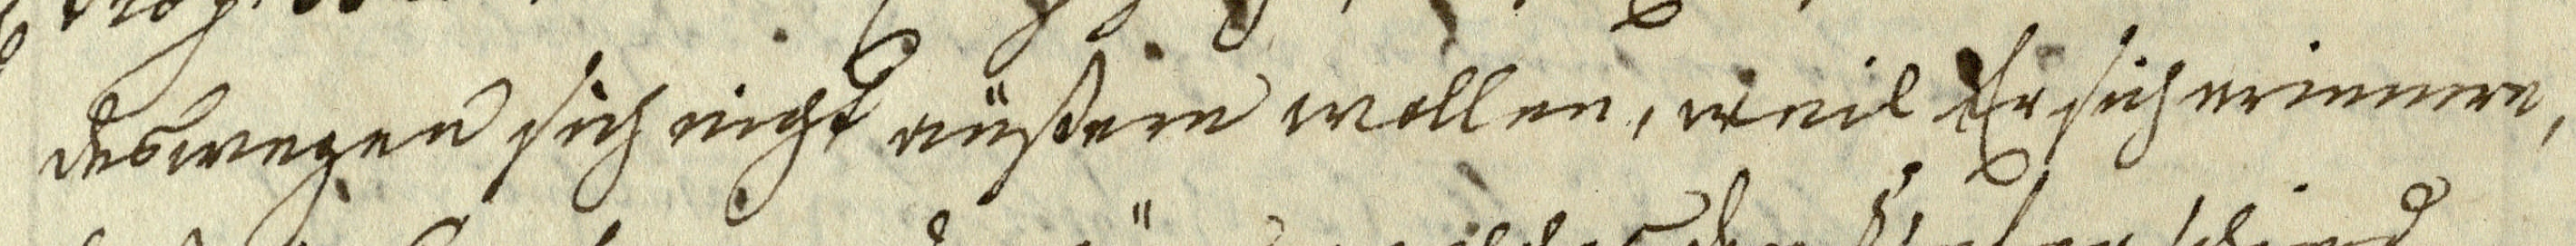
deswegen sich nicht äußern wollen, weil Er sich erinnere,
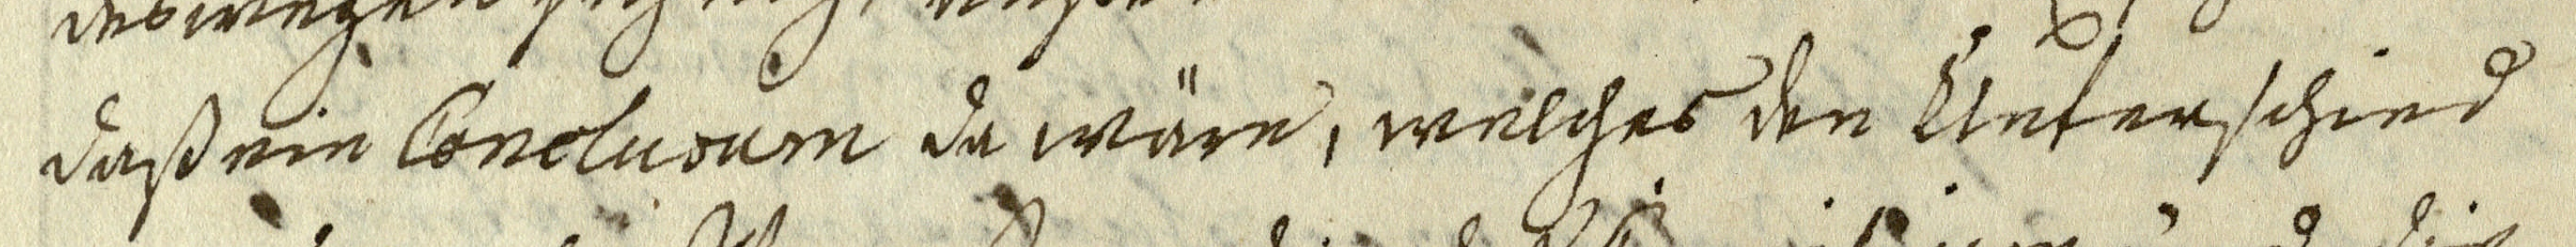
daß ein Conclusum da wäre, welches den Unterschied
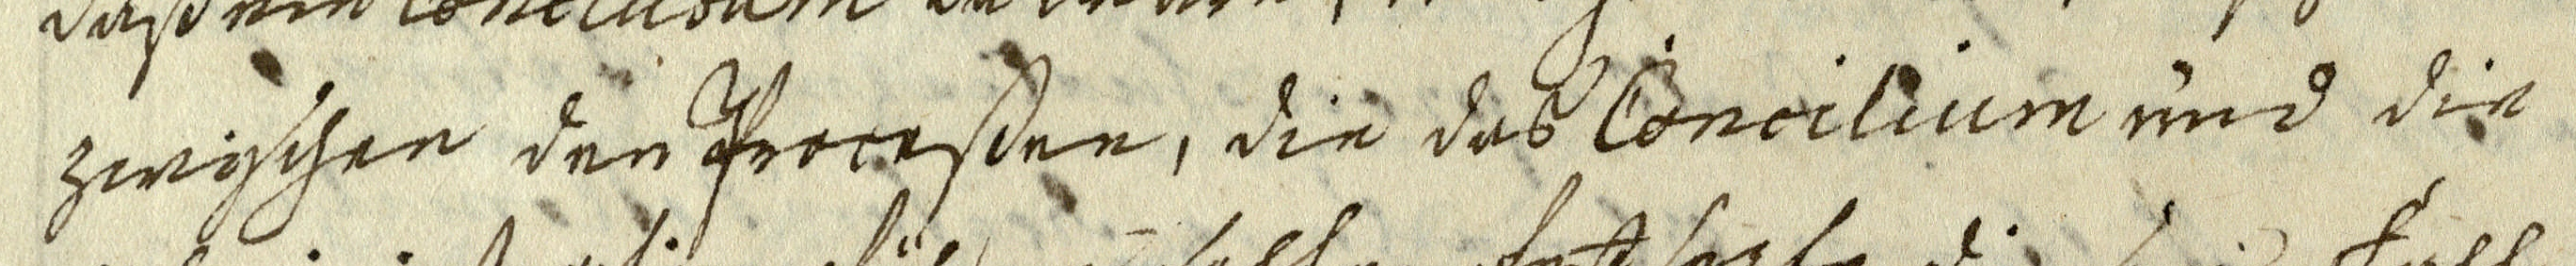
zwischen den Proceßen, die das Concilium und die
